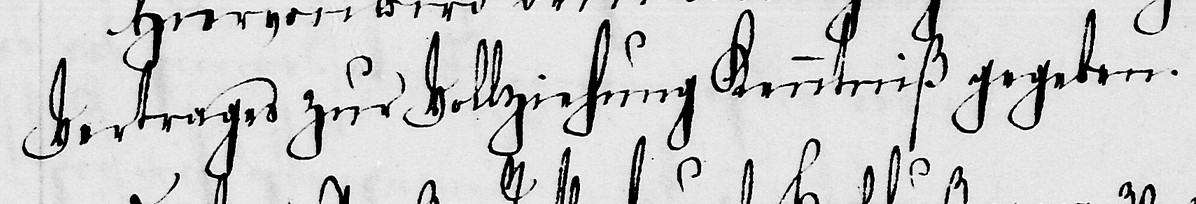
Vertrages zur Vollziehung Kenntniß gegeben.
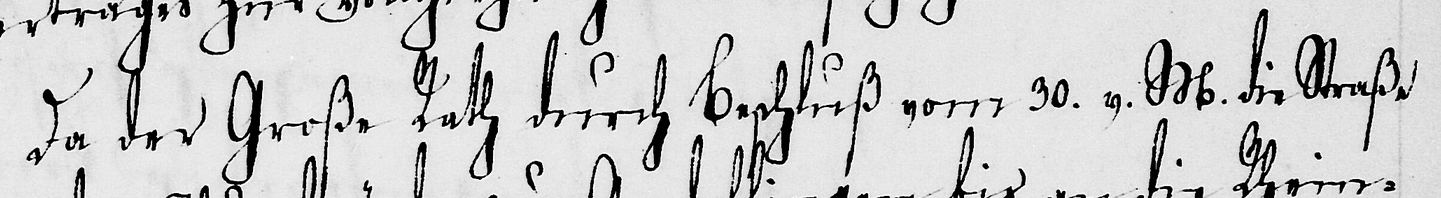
Da der Große Rath durch Beschluß vom 30. v. M. die Straße
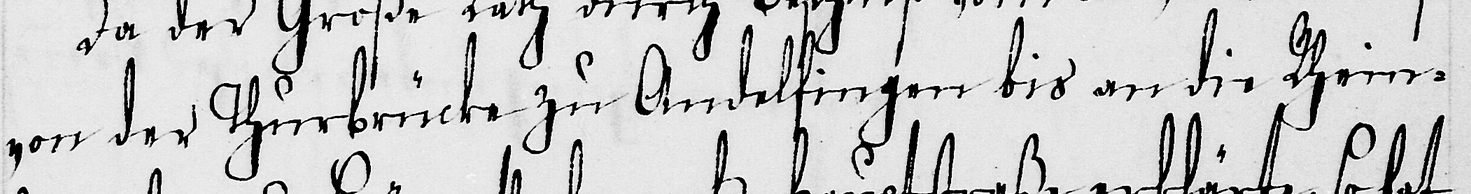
von der Thurbrücke zu Andelfingen bis an die Rhein¬
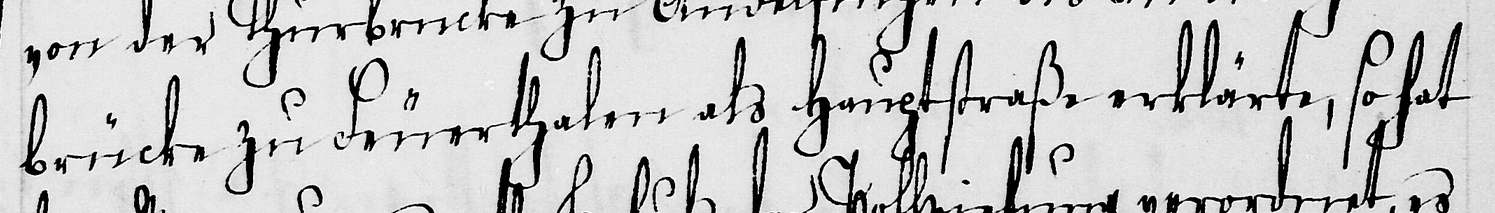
brücke zu Feuerthalen als Hauptstraße erklärte, so hat
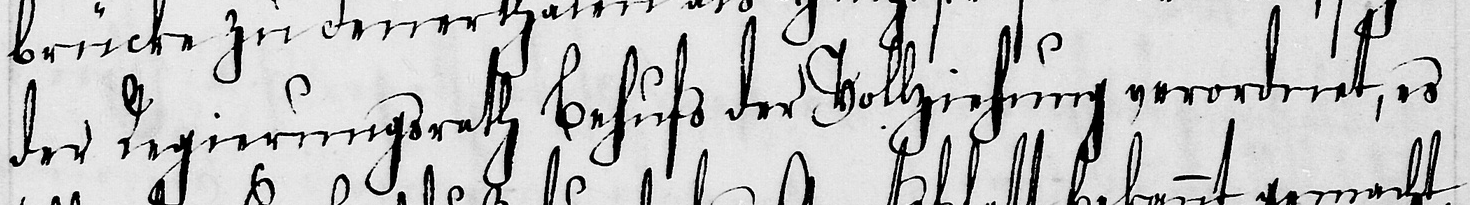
der Regierungsrath Behufs der Vollziehung verordnet, es
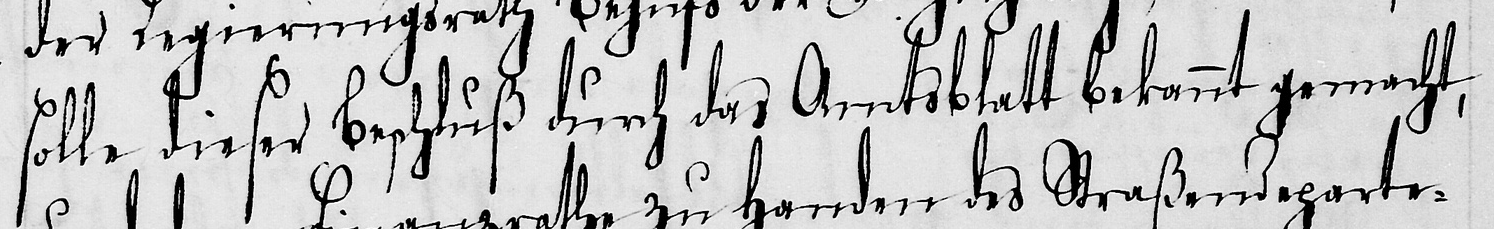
solle dieser Beschluß durch das Amtsblatt bekannt gemacht,
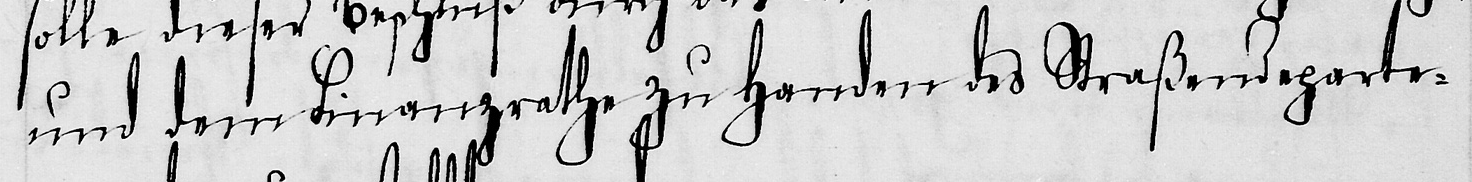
und dem Finanzrathe zu Handen des Straßendeparte¬
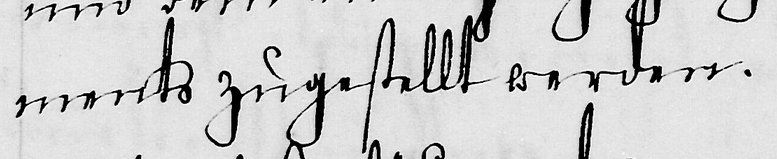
ments zugestellt werden.
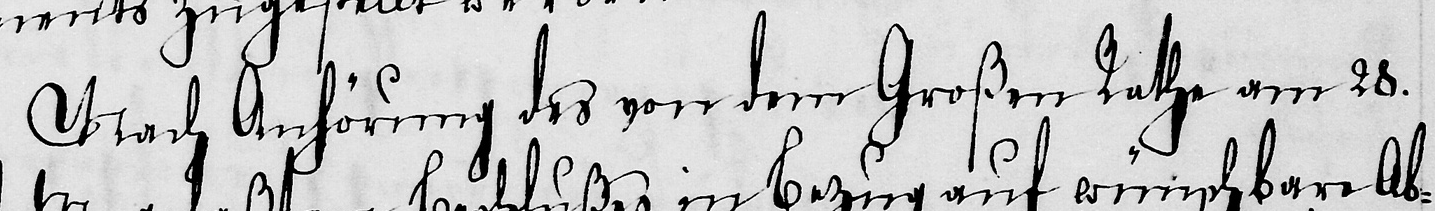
Nach Anhörung des von dem Großen Rathe am 28.
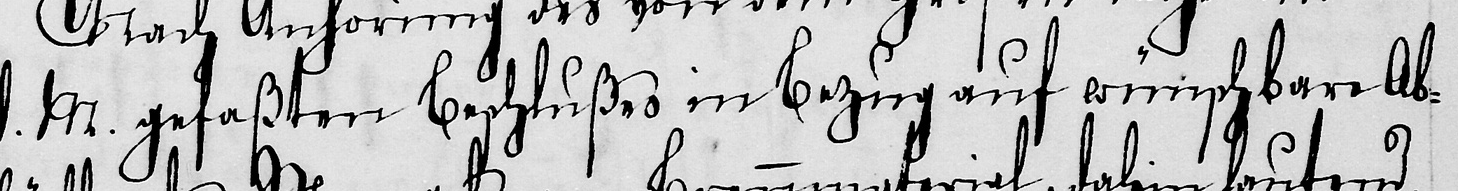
M. gefaßten Bschlußes in Bezug auf wünschbare Ab¬
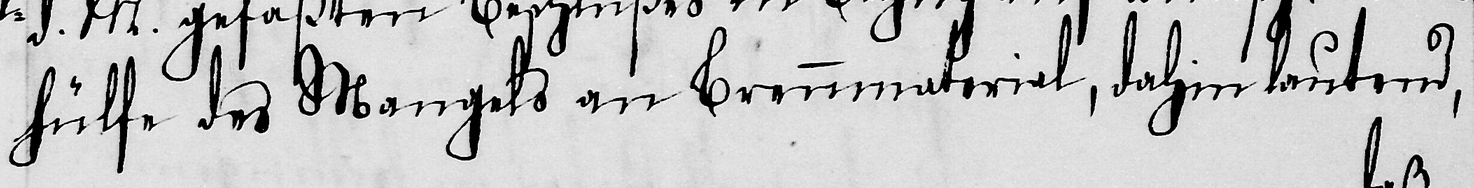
hülfe des Mangels an Brennmaterial, dahin lautend,
